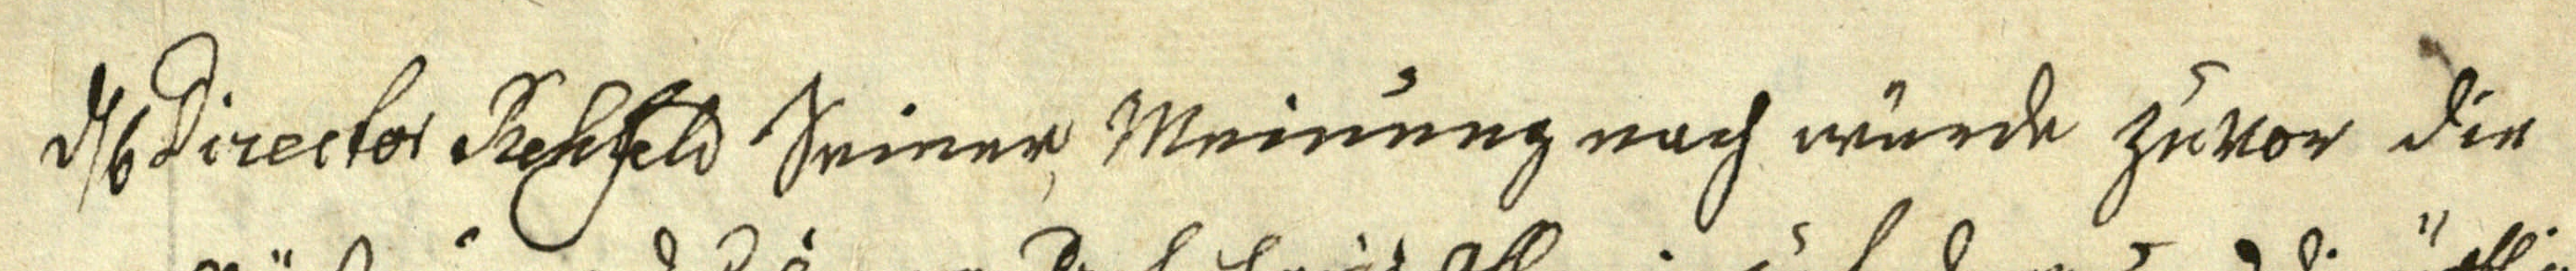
dh Director Rehfeld Seiner Meinung nach würde zuvor die
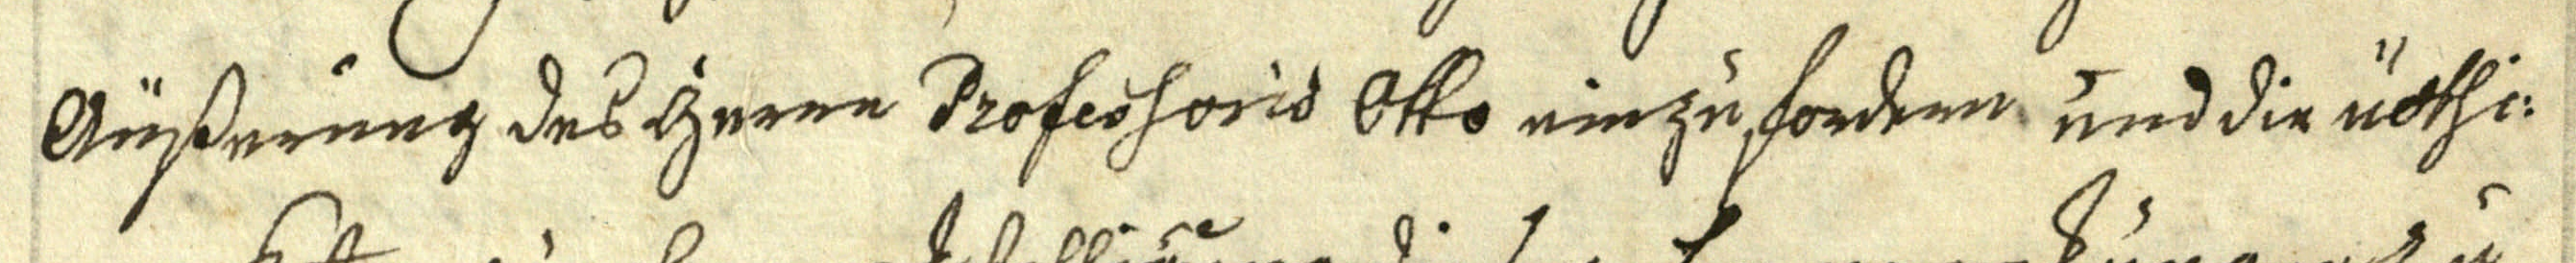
Äußerung des Herrn Professoris Otto einzufordern und die nöthi¬
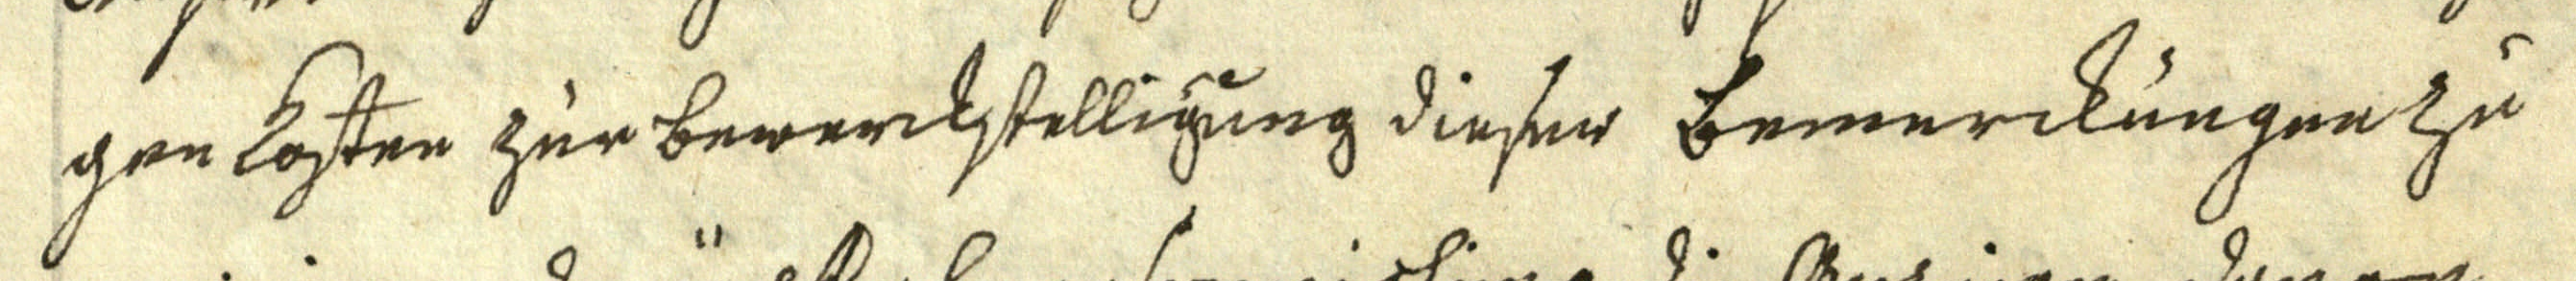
gen Kosten zur Bewerkstelligung dieser Bemerkungen zu
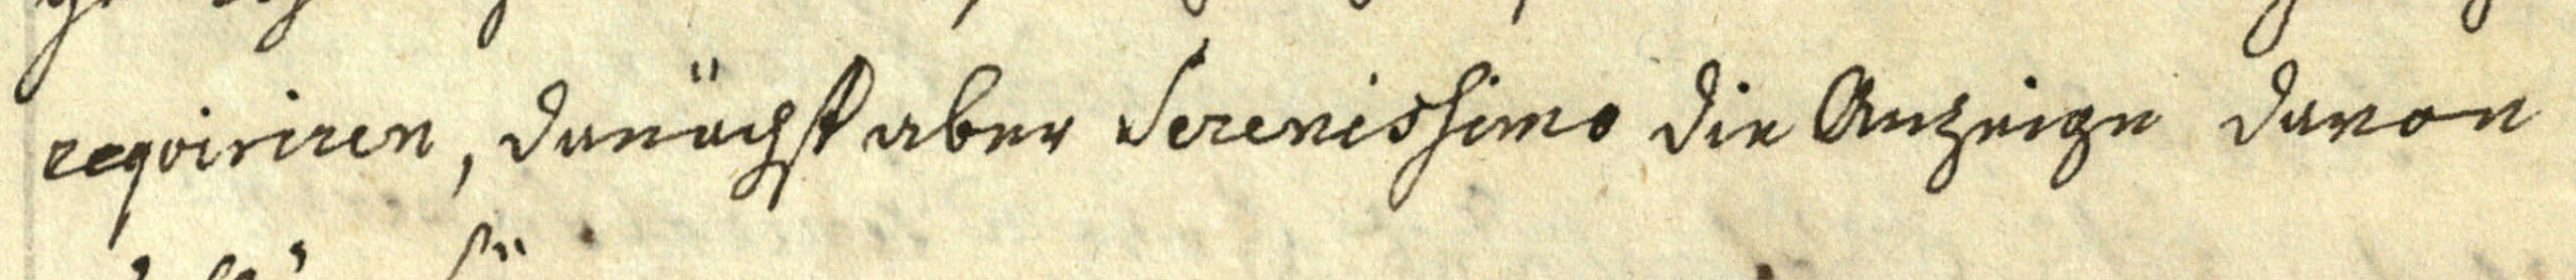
requiriren, danächst aber Serenissimo die Anzeige davon
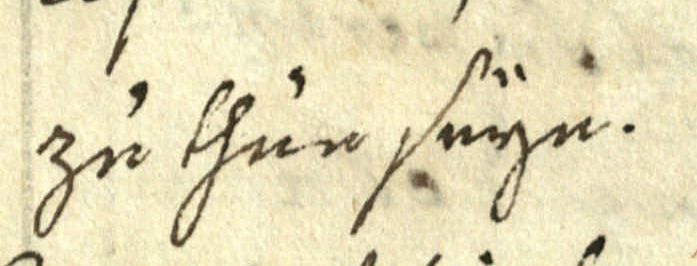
zu thun seÿn.
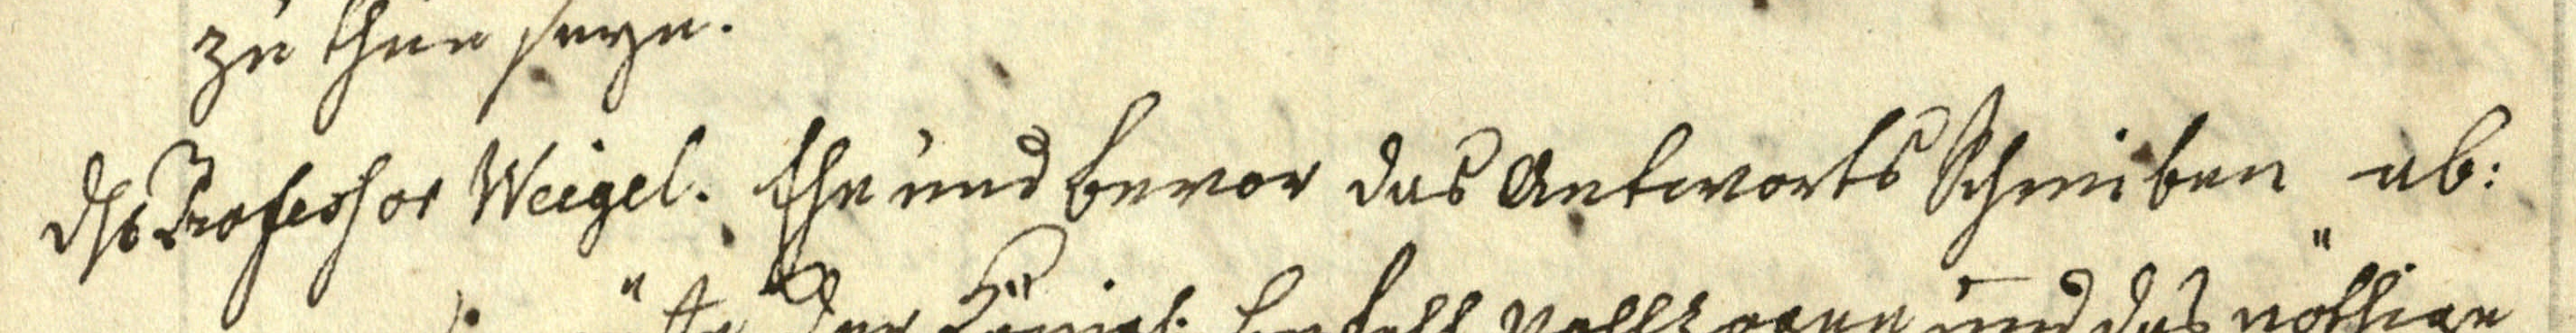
dh Professor Weigel. Ehe und bevor das Antworts Schreiben ab¬
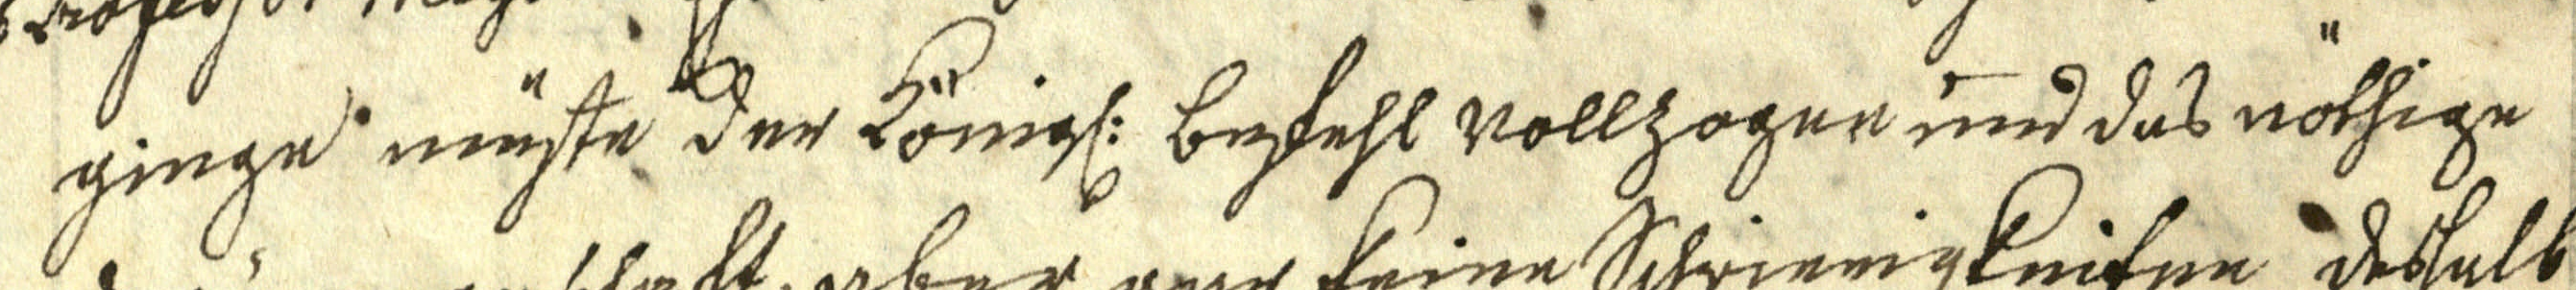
ginge müste der Königl. Befehl vollzogen und das nöthige
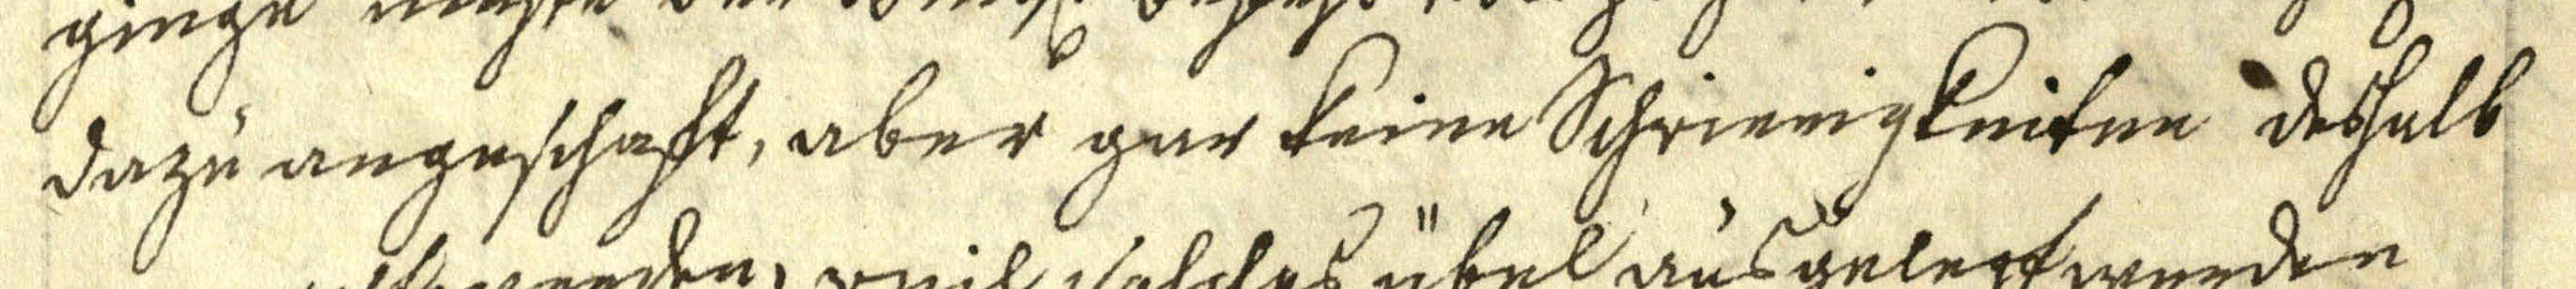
dazu angeschaft, aber gar keine Schwierigkeiten deshalb
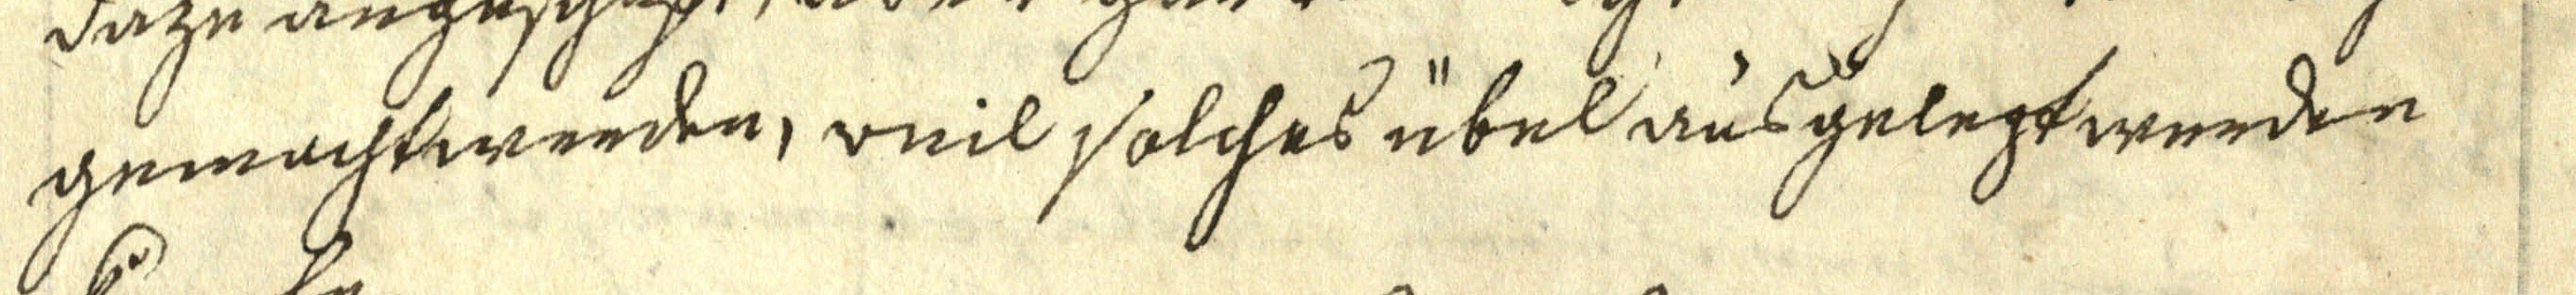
gemacht werden, weil solches übel ausgelegt werden
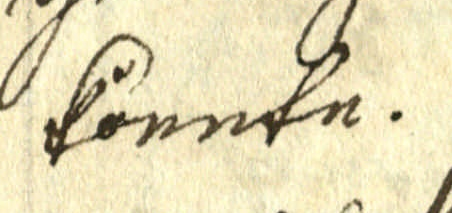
könnte.
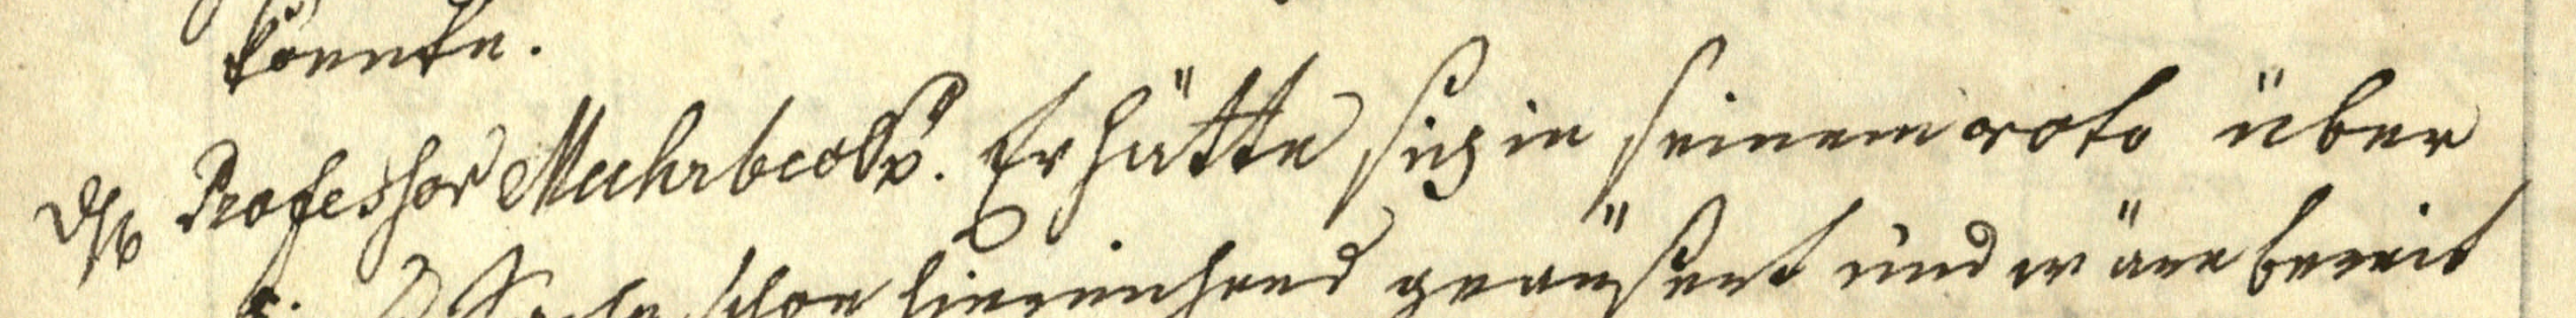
dh Professor Muhrbeck. Er hätte sich in seinem voto über
